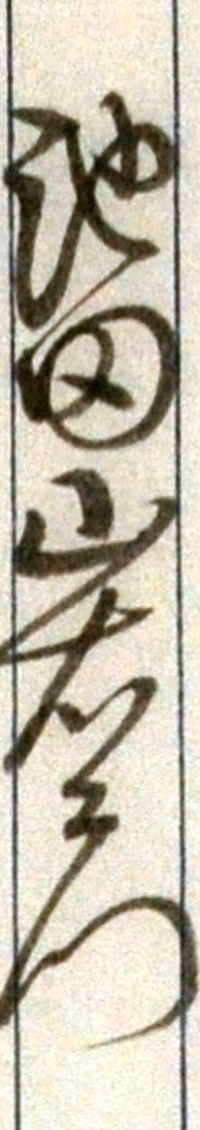池田山右衛門
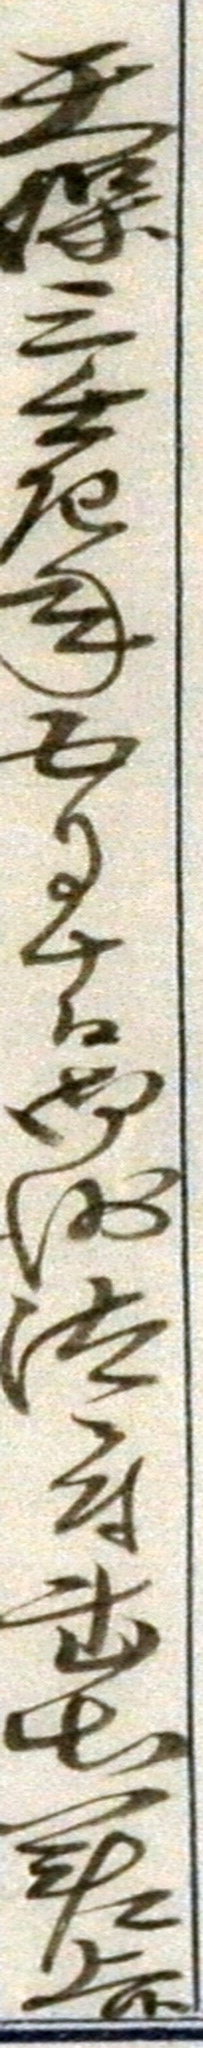天保三壬辰年五月十日御沙汰ニ付書出差上候

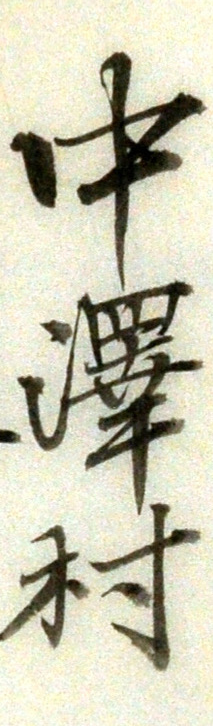中澤村
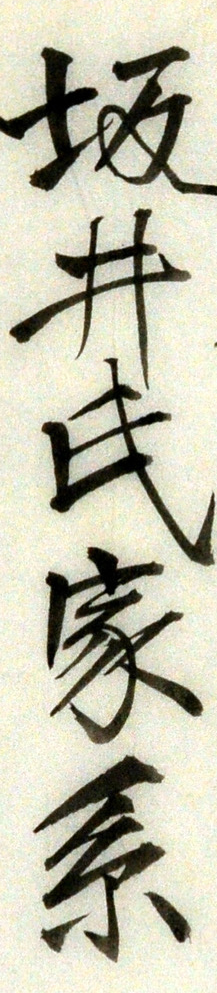坂井氏家系
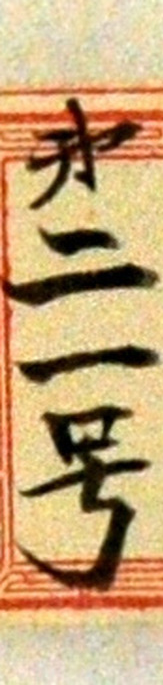第二一号

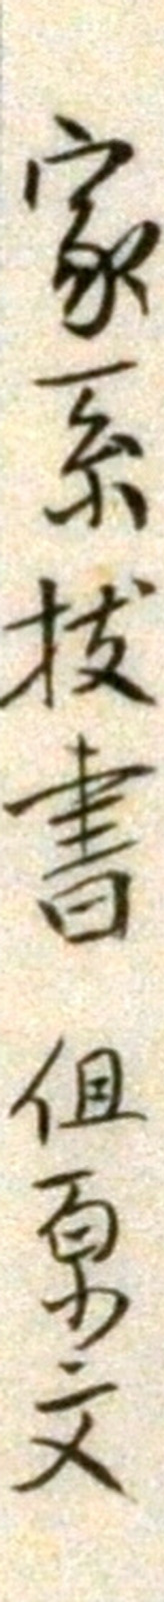家系抜書但原文
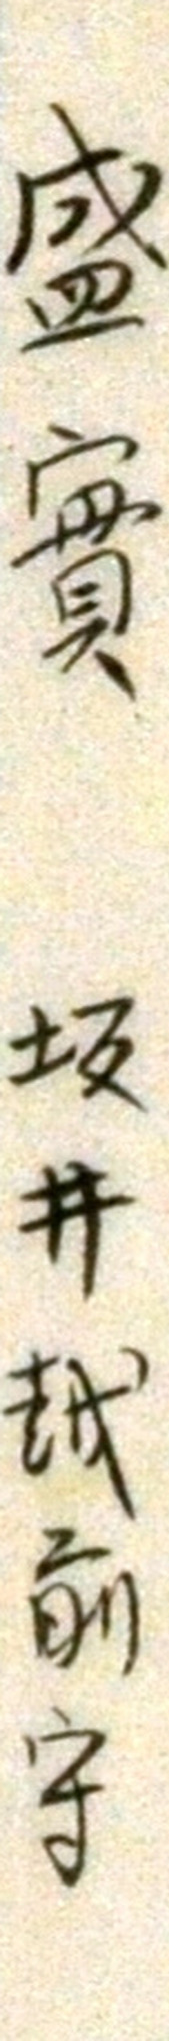盛実坂井越前守
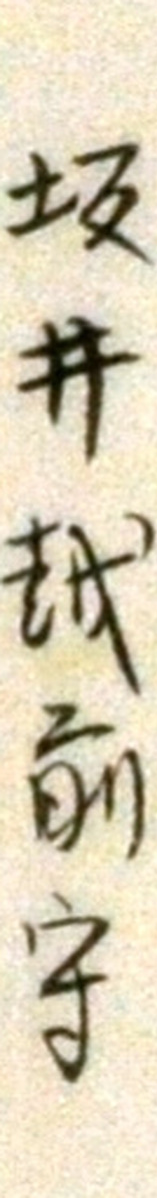盛実坂井越前守
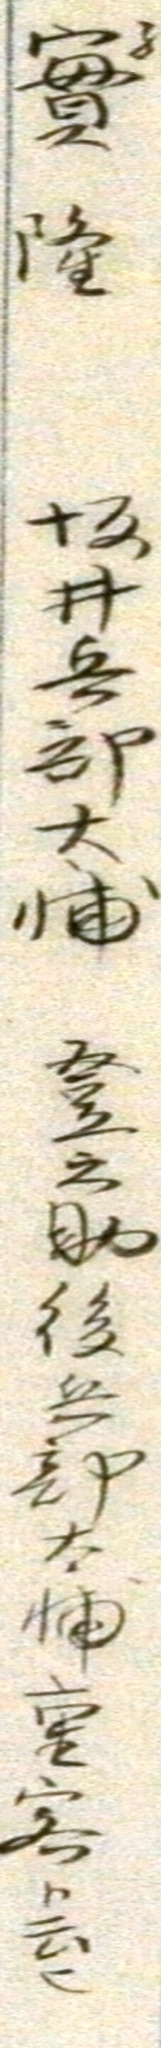孫実隆坂井兵部大輔登之助後兵部大輔重客ト云ヒ
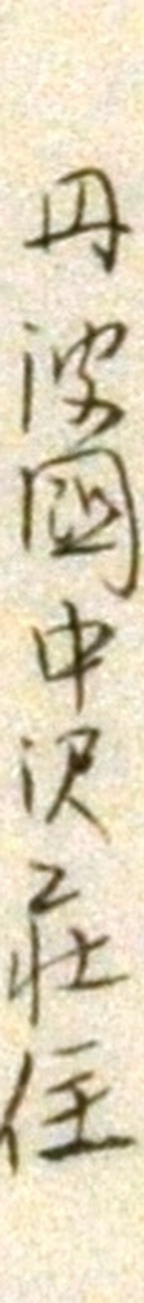丹波国中沢荘住
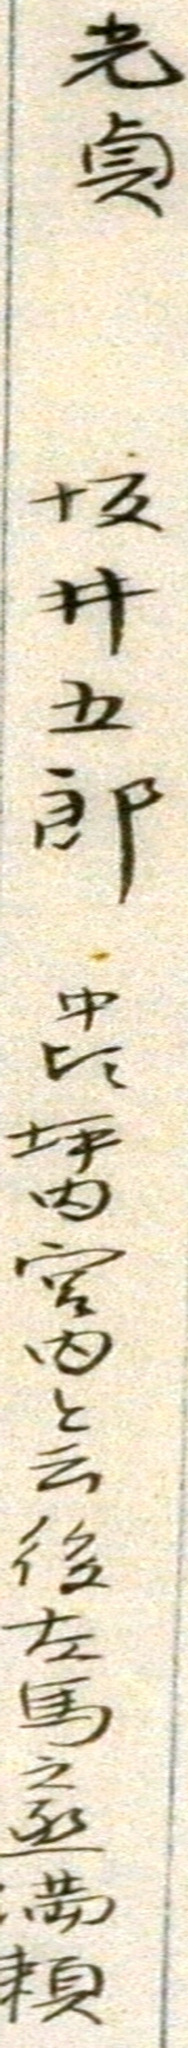老貞坂井五郎中頃坪内宮内と云後左馬之丞満頼
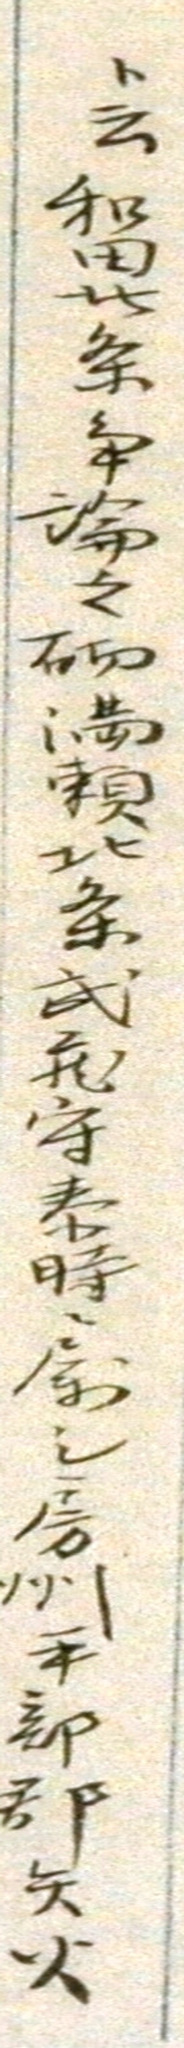ト云和田北条争論之砌満頼北条氏蔵守泰時ニ属シ房州平部郡矢火
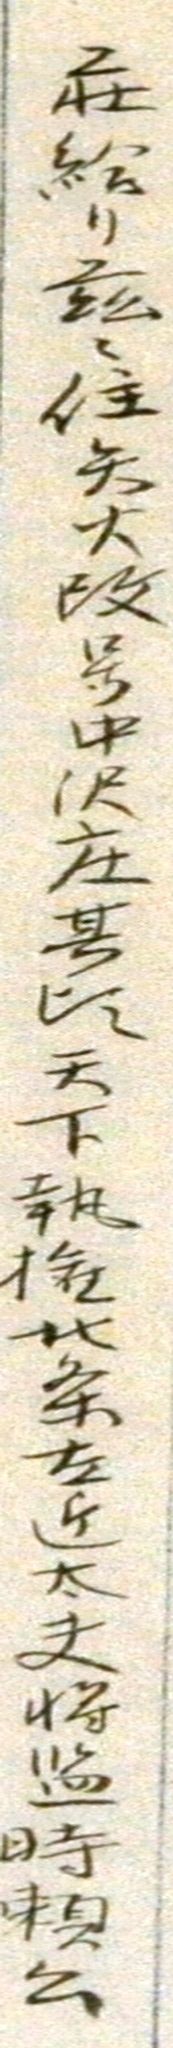荘給り茲ニ住矢大改号中沢庄其頃天下執権北条左近太夫将監時頼公
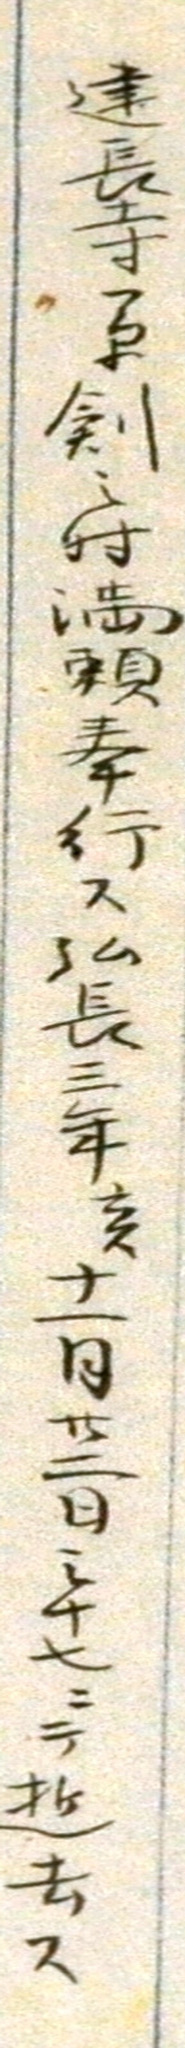建長寺◻︎剣之時満頼奉行ス弘長三年亥十一月廿二日之十七ニテ逝去ス
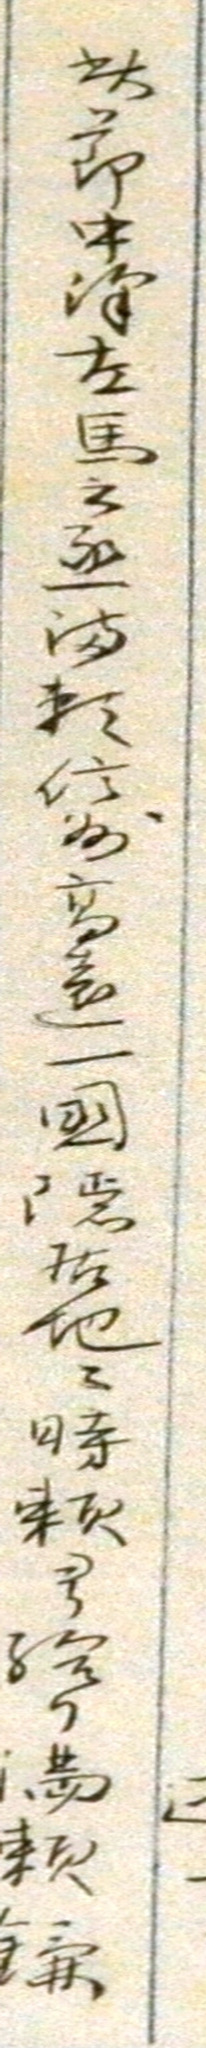此節中津左馬之丞満頼信州高遠一国隠居地ニ時頼ヨリ給り満頼鎌
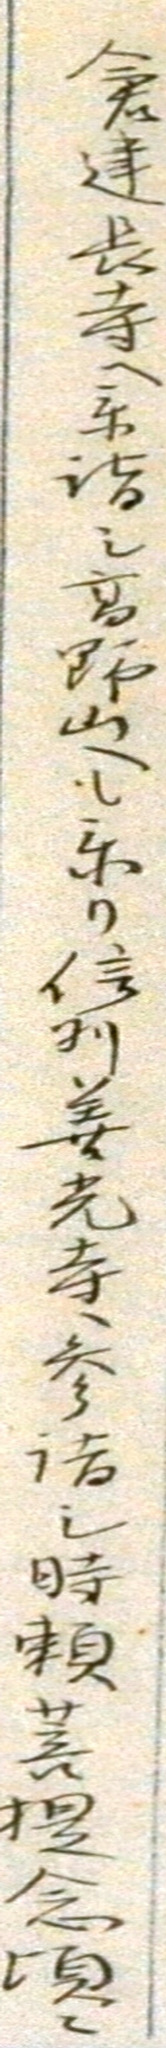倉建長寺へ参詣シ高野山へも参り信州善光寺へ参詣シ時頼菩提念頃ニ
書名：三好氏先代以来勤仕録、池田丈介一家勤仕録
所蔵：伊那市立高遠町図書館・合同会社AMANE
